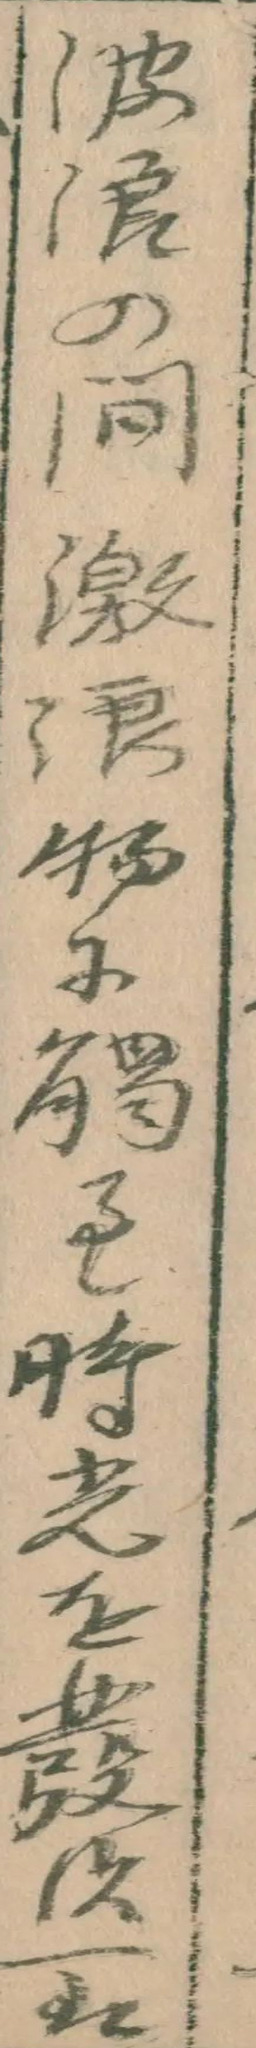波浪の間激浪物に触るゝ時光を発す一は
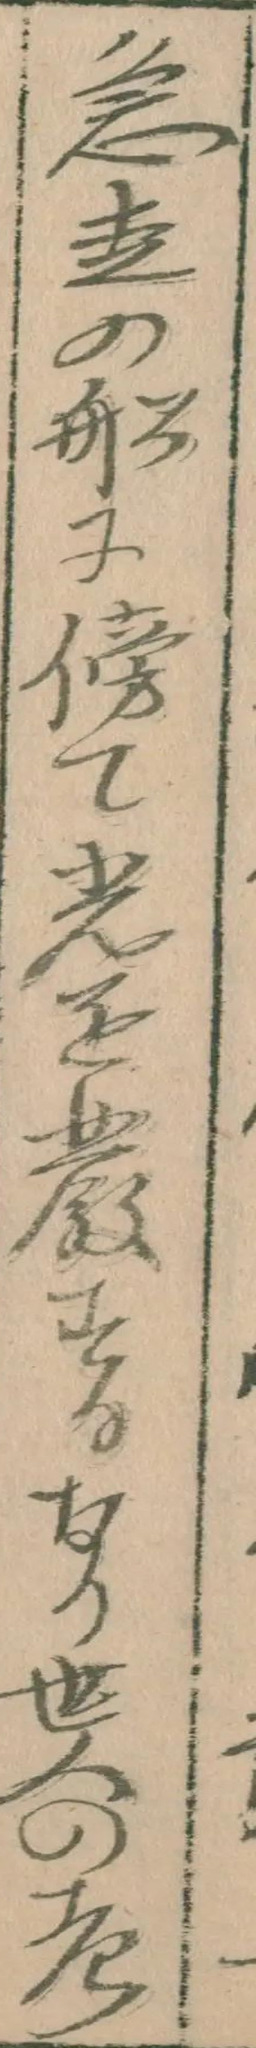急走の船に傍て光を発するなり世人の考
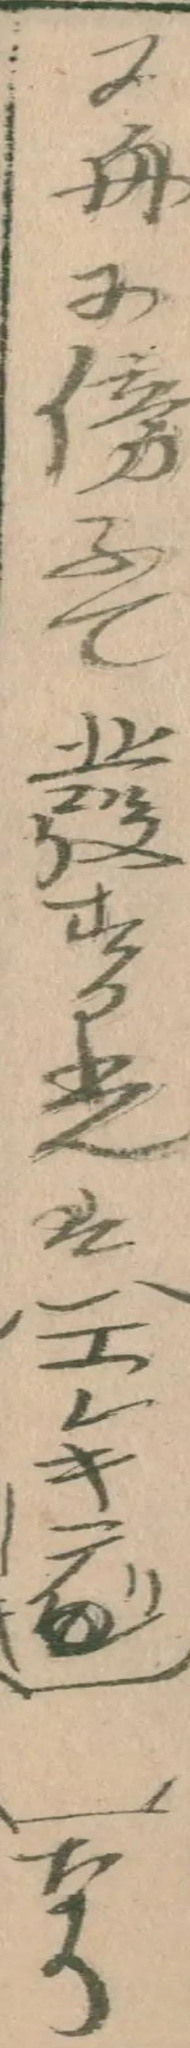に舟に傍ふて発する光は(エレキテリーキ)なり
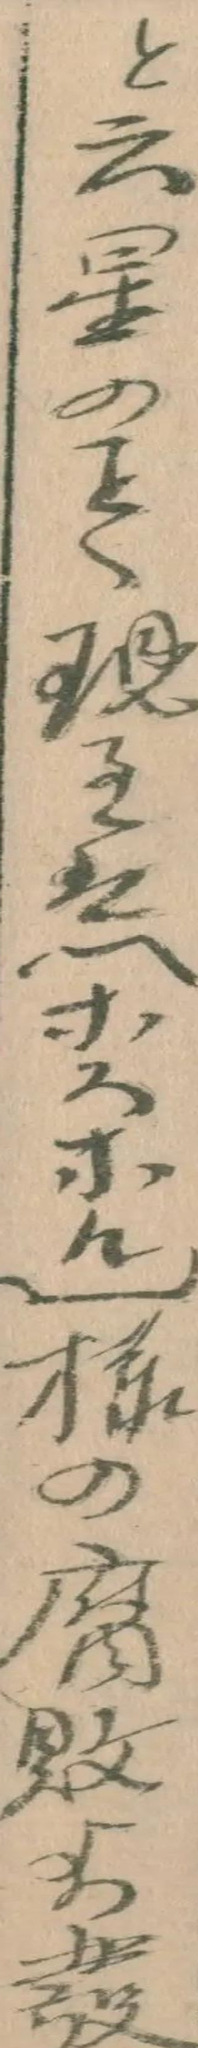と云星のことく現るゝは(ホスホル)様の腐敗より発
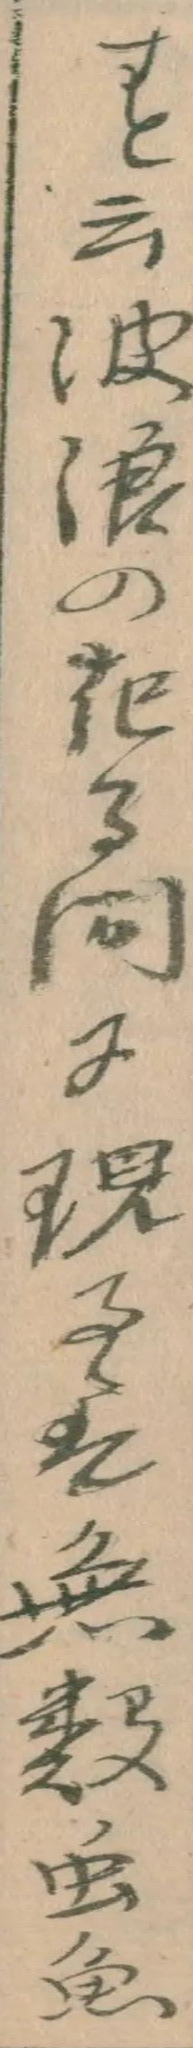すと云波浪の起る間に現るゝは無数ノ虫魚
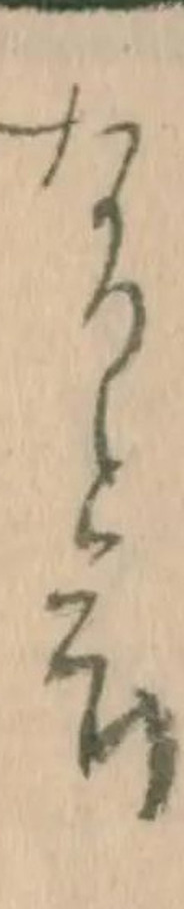なりと云
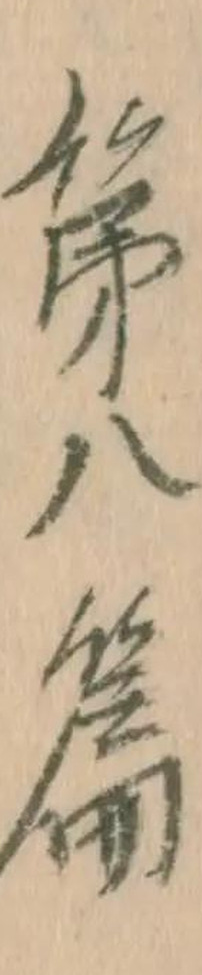第八篇
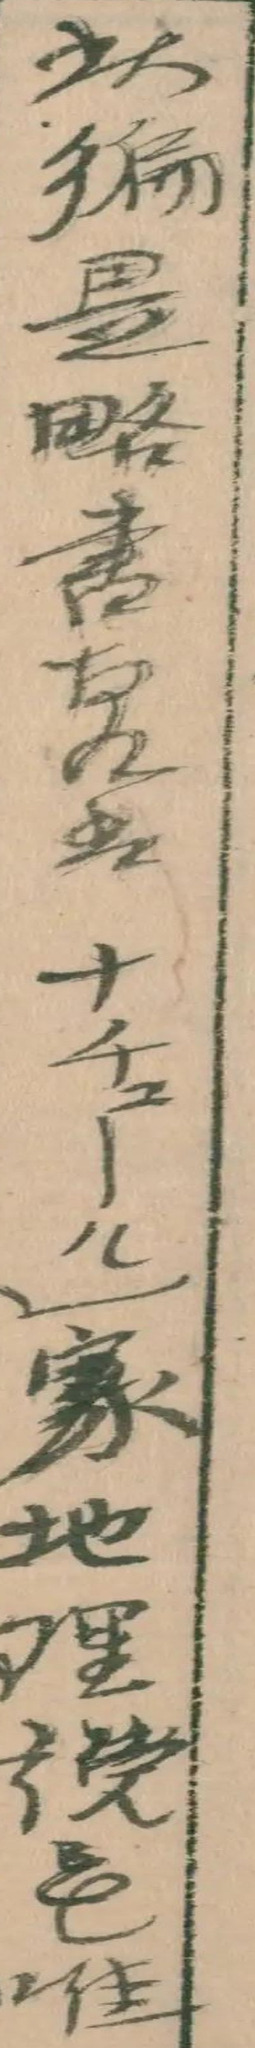此編是略書なれはナチュール)家地理説も唯
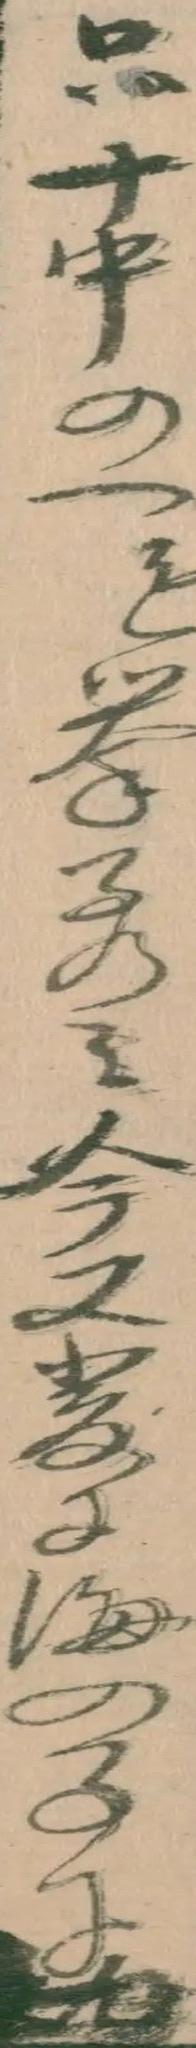只十中の一を挙るのみ今又爰に海の事に
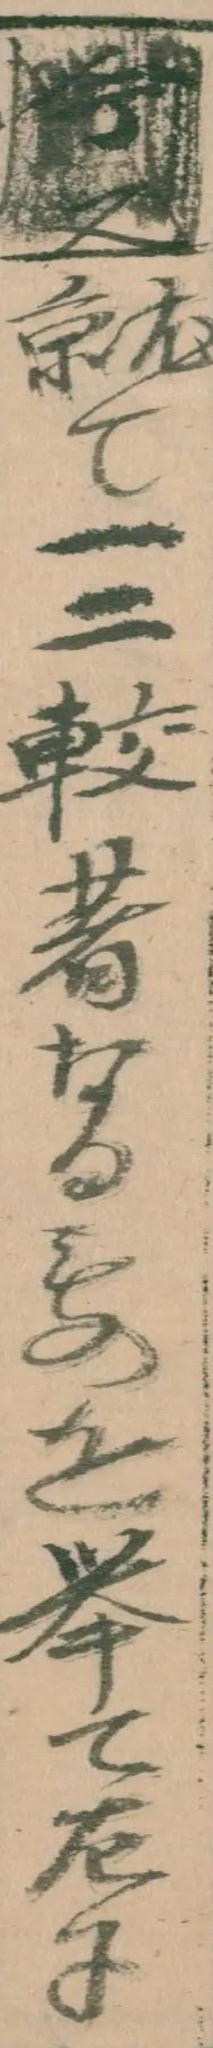就て一二較著なるものを挙て左に
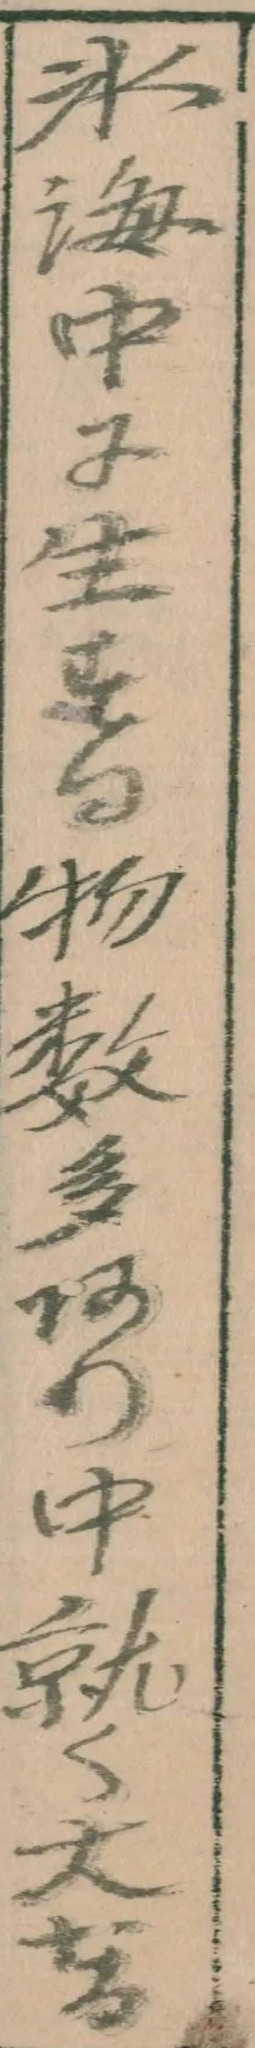氷海中に生する物数多あり中就く大なる
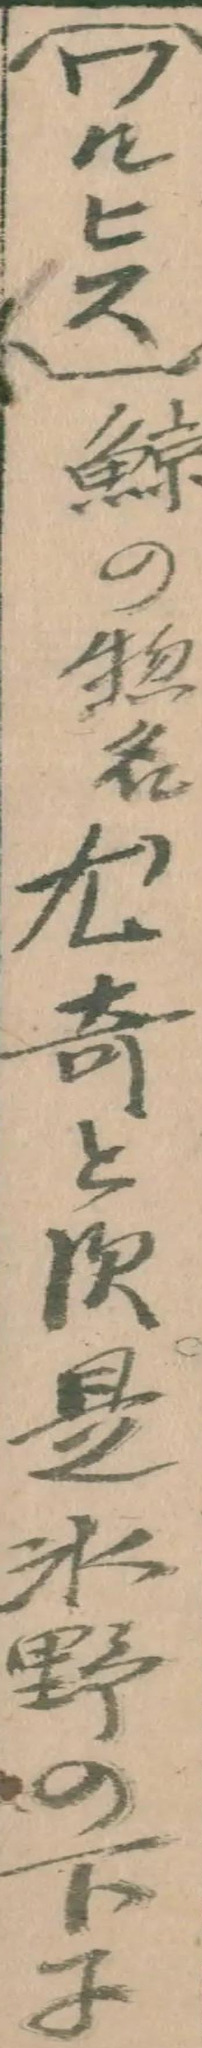(ワルヒス)鯨の惣名尤奇とす是氷野の下に
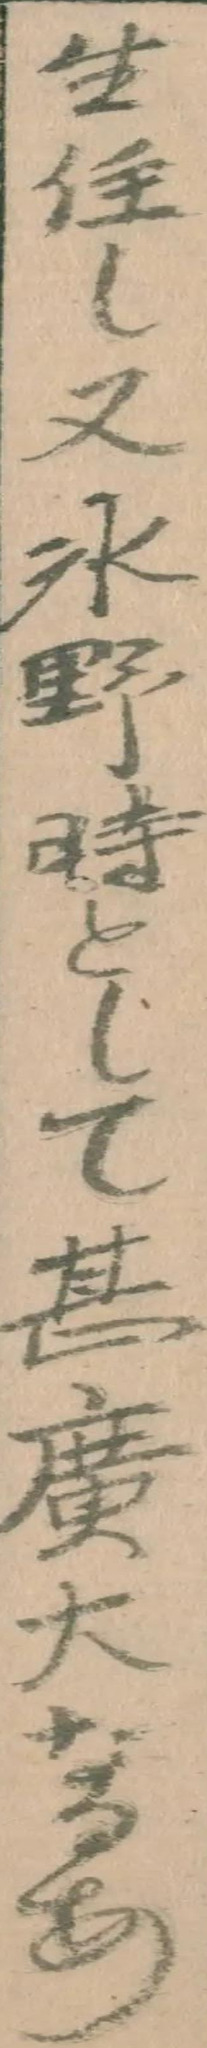生住し又氷野時として甚広大なるあ
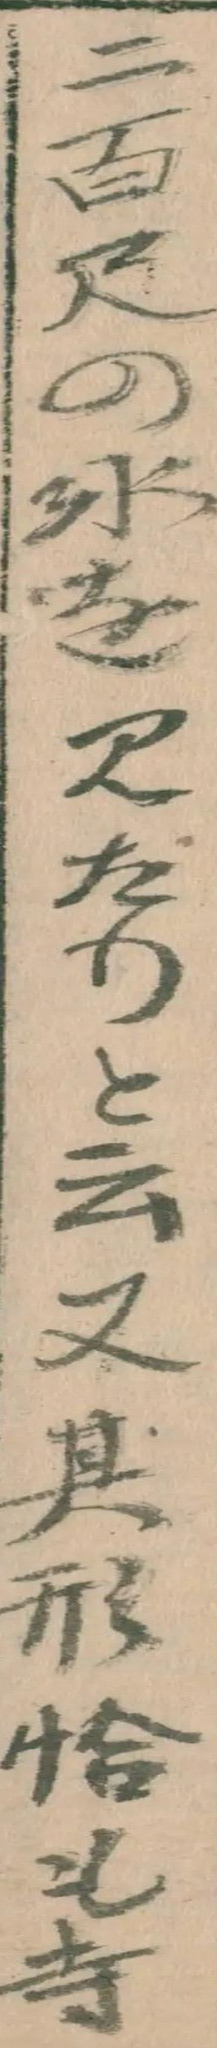二百尺の氷を見たりと云又形恰も寺
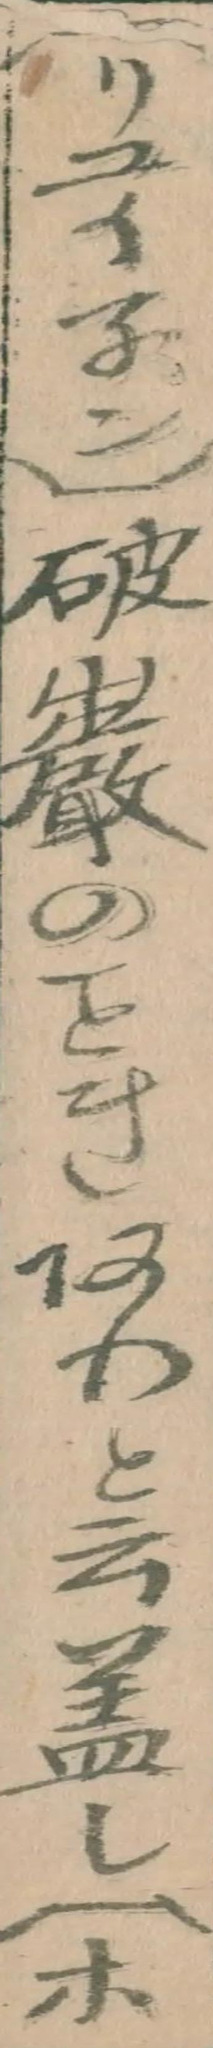(リユイネン)破巌のこときありと云蓋し(ホ

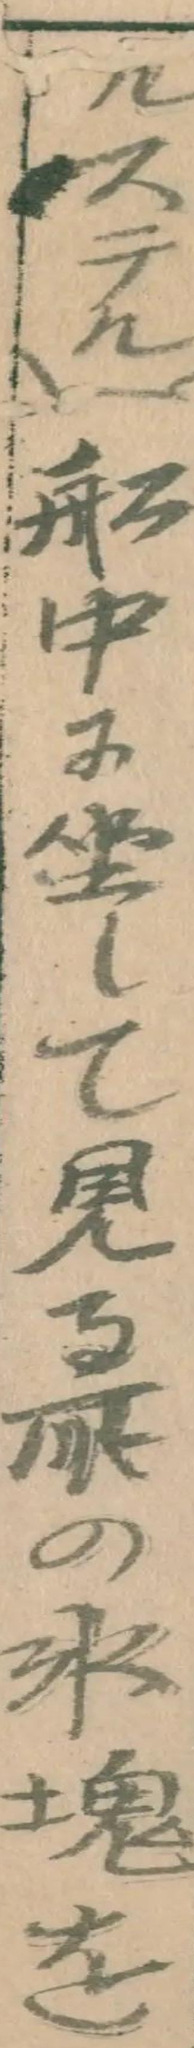ルステル)船中に坐して見る所の氷塊を
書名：新釈輿地図説
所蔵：国立国会図書館 National Diet Library, JAPAN
